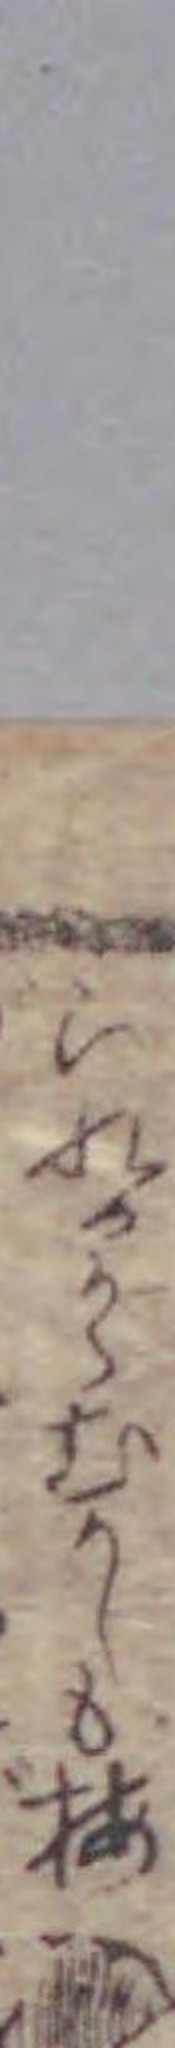られるからむかしも梅
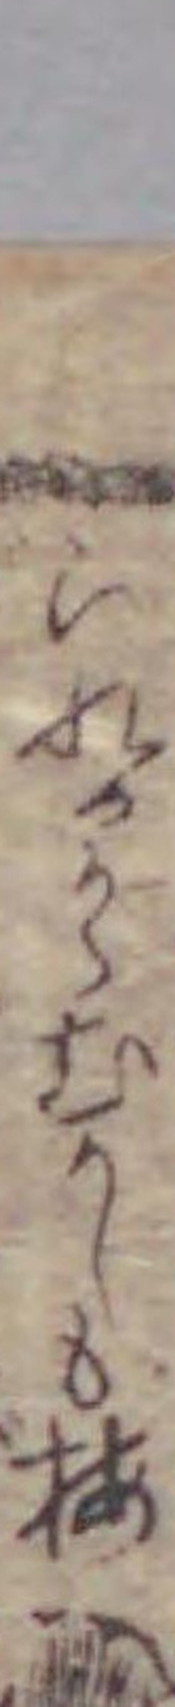られるからむかしも梅
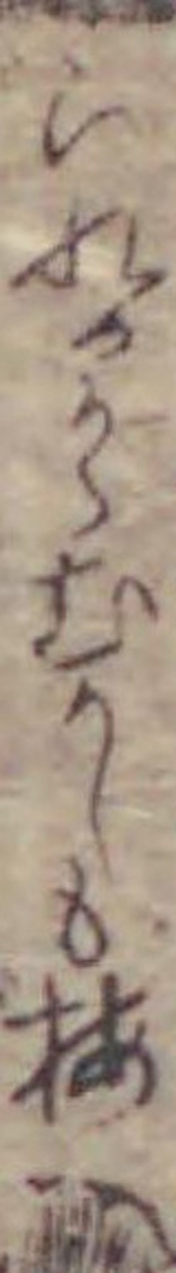られるからむかしも梅
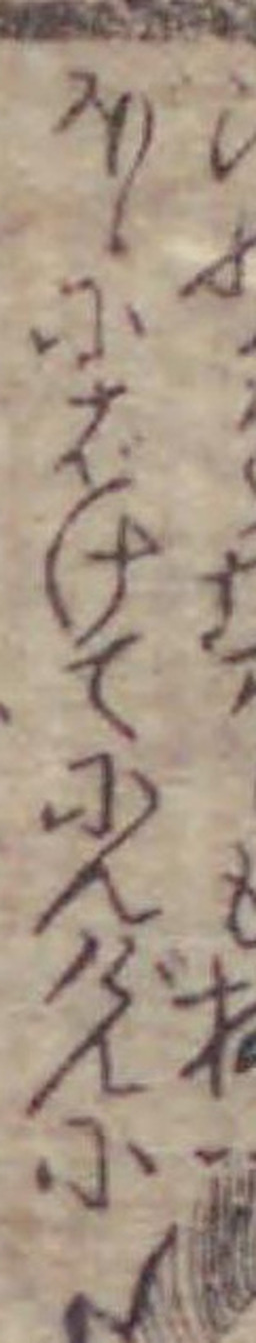ぼしにばけてにんげんに
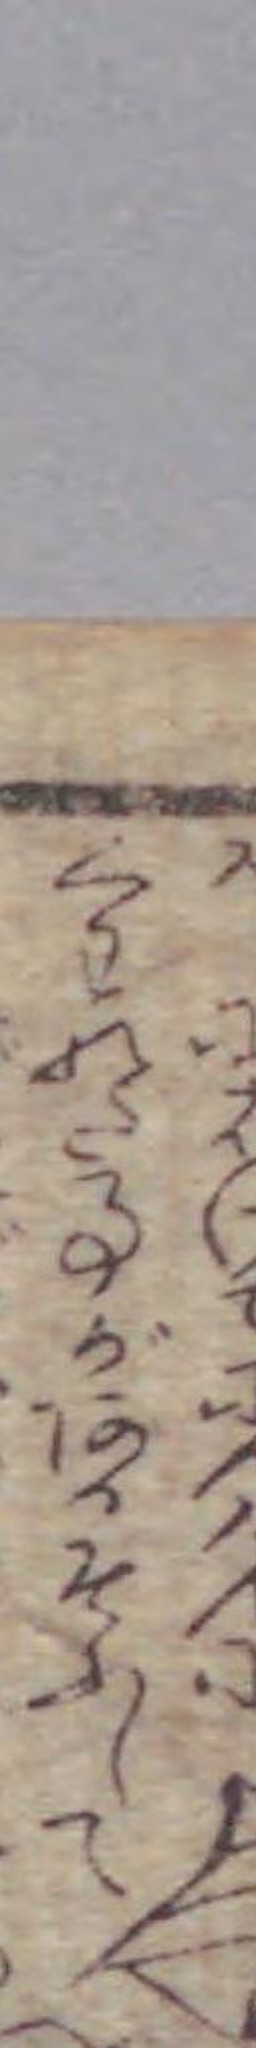くわれた事があるそふして
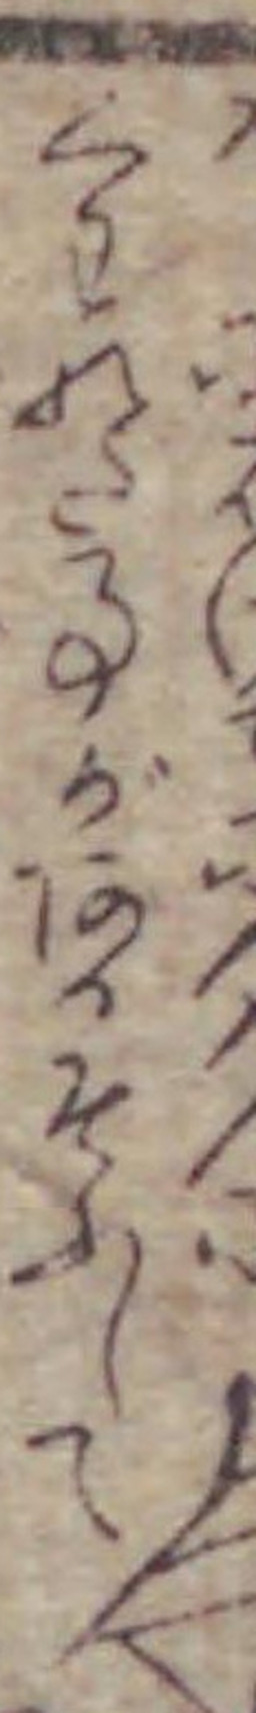くわれた事があるそふして
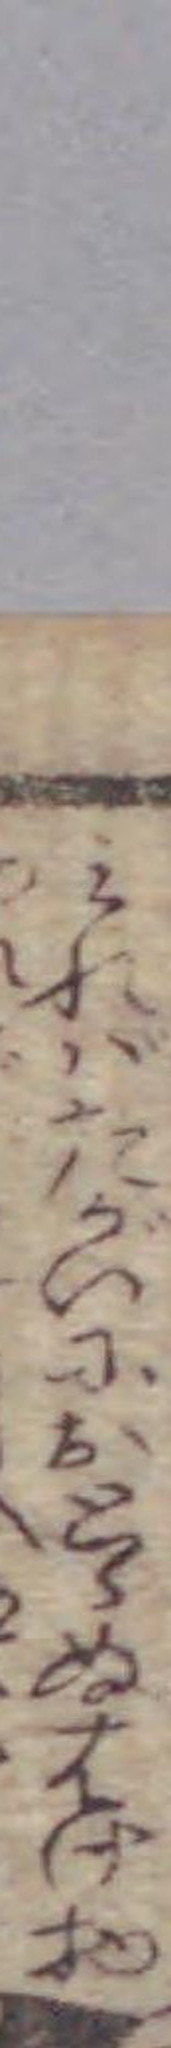みればたがいにおとらぬはけ物
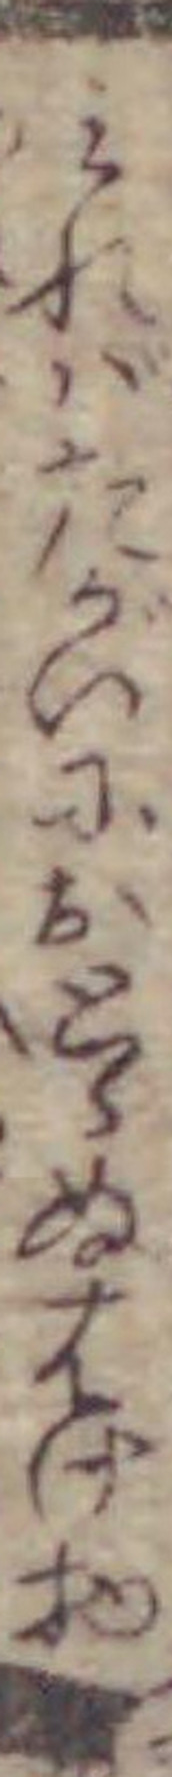みればたがいにおとらぬはけ物
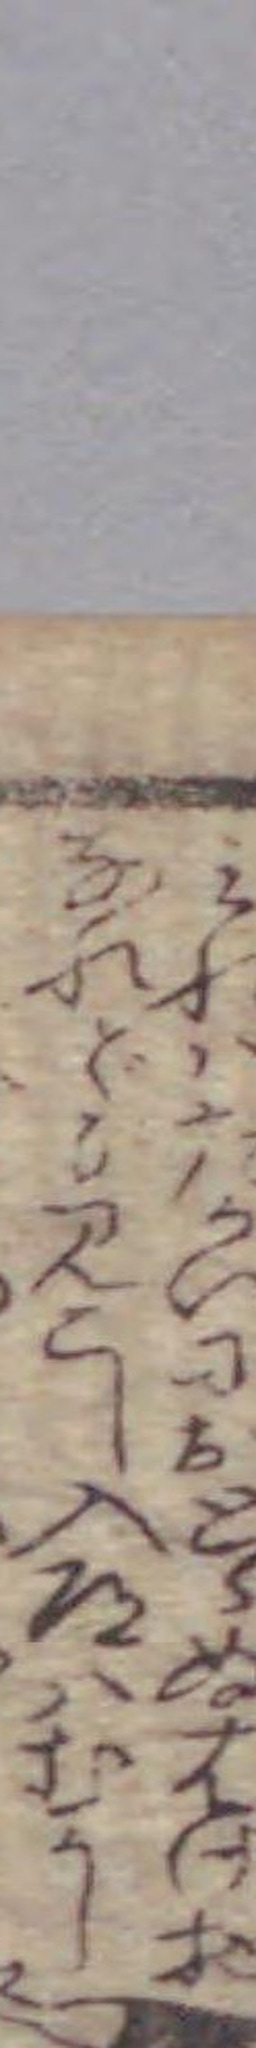なれども見こし入道はむかし
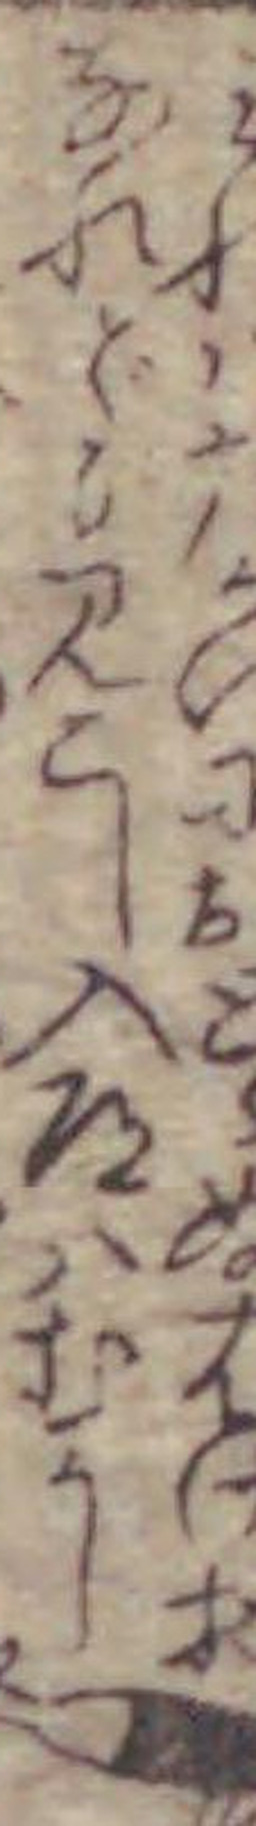なれども見こし入道はむかし
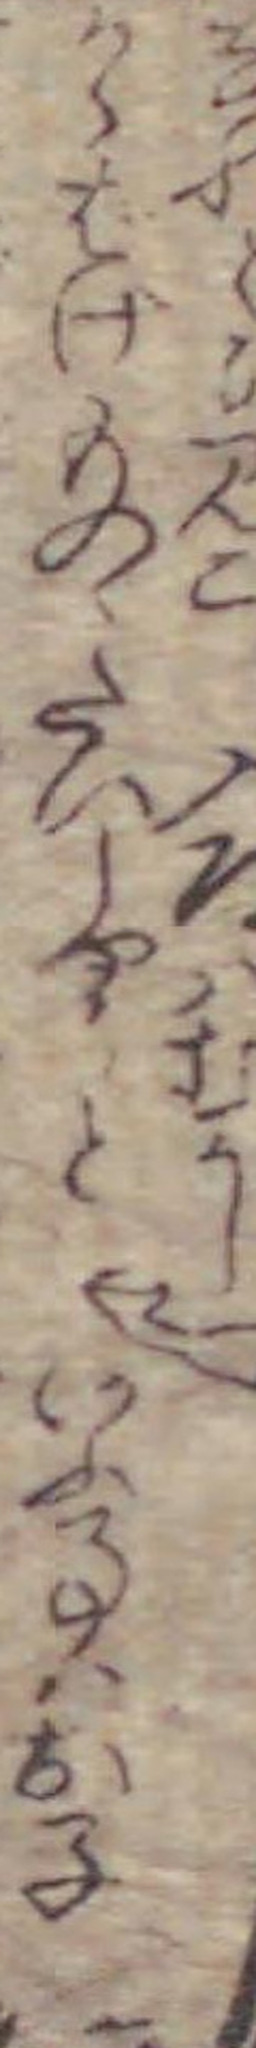からばけものゝたいしやうといふ事はお子
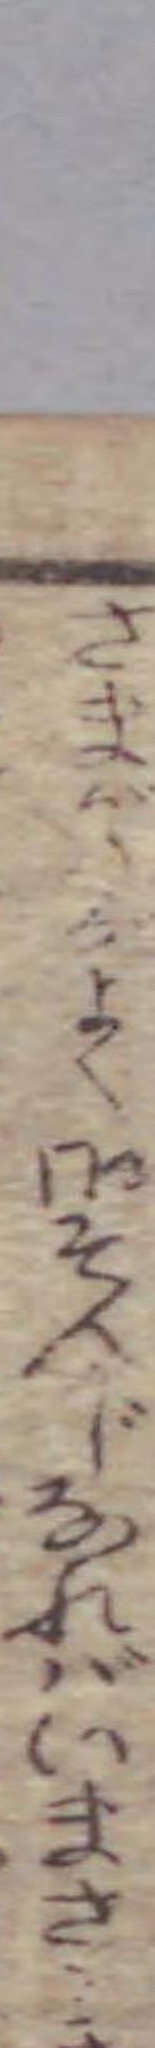さまがたがよく御そんじなればいまさらき
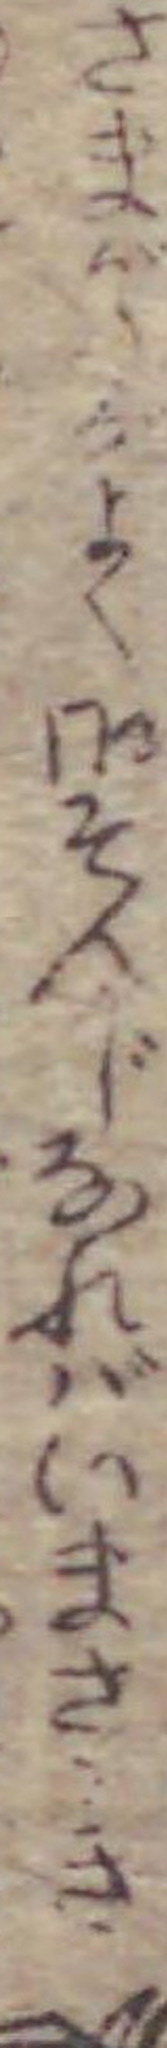さまがたがよく御そんじなればいまさらき
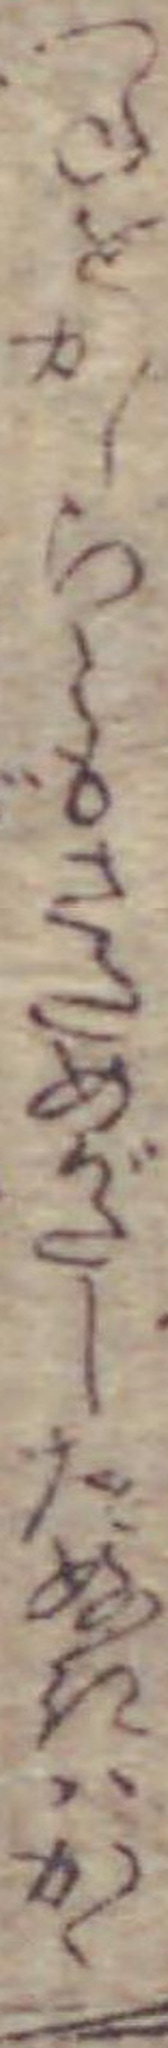つねをかしらともさためがたしたぬきはかく
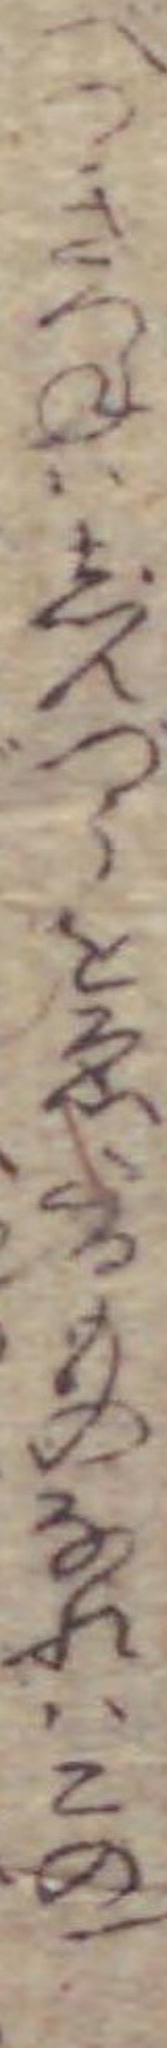べつきつねはじんづうをゑたるものなれはこの
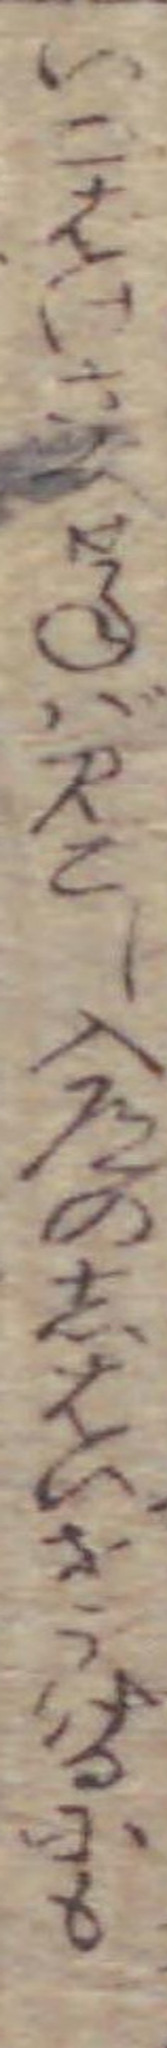いこばけさへせねば見こし入道のしはいをうけるにも
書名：化物仲間破 : 2巻
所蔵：国立国会図書館 National Diet Library, JAPAN
